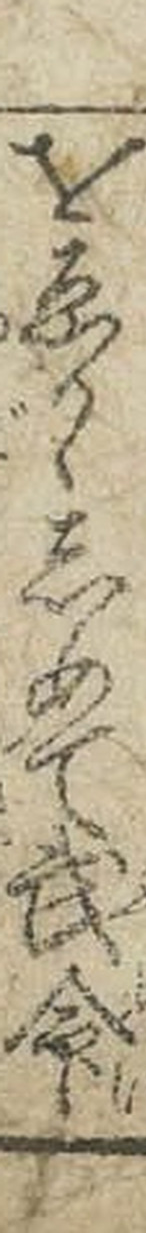をゑかゝしめて武命
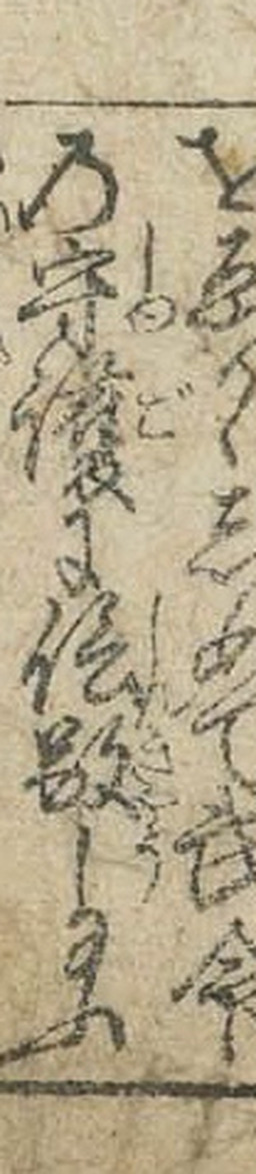の守護に信敬し給ふ
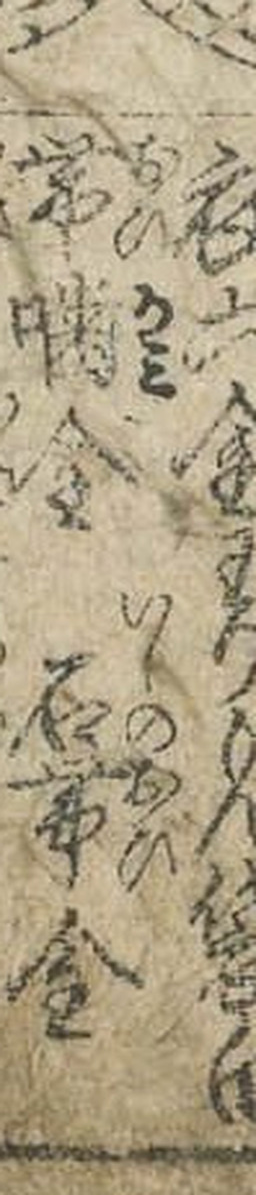帯噛金石帯金
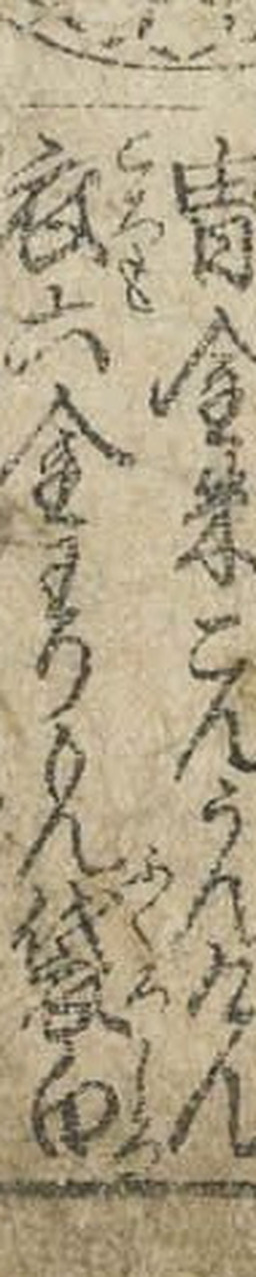衣六金わりもん袋白
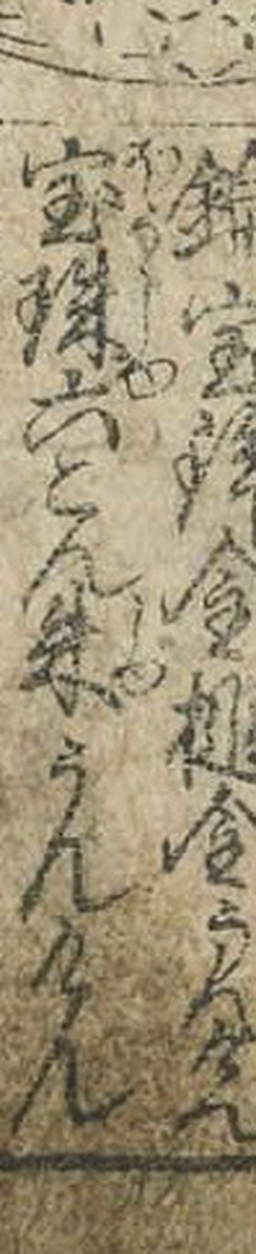宝珠六こん朱うんけん
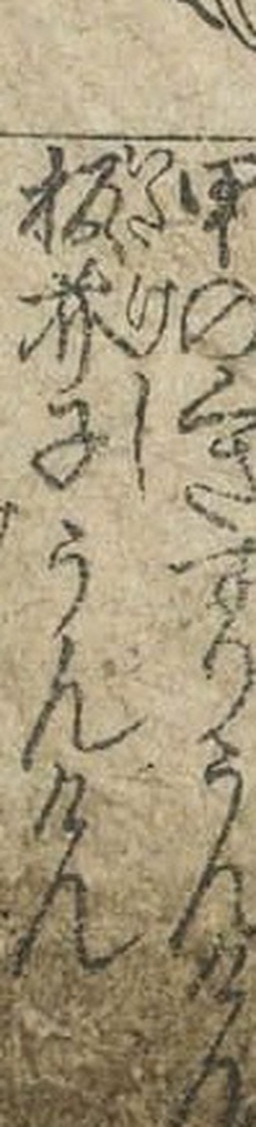板芥子うんけん
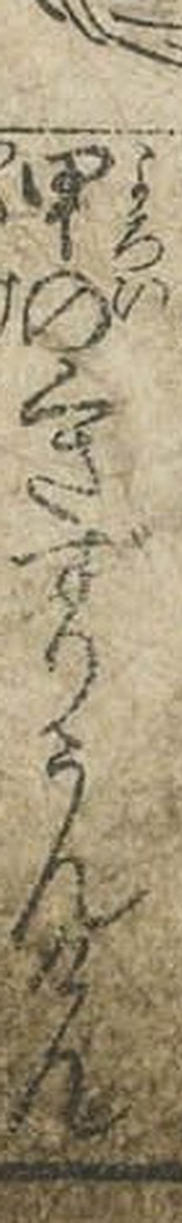甲のくさずりうんけん
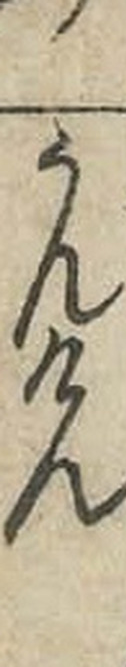うんけん
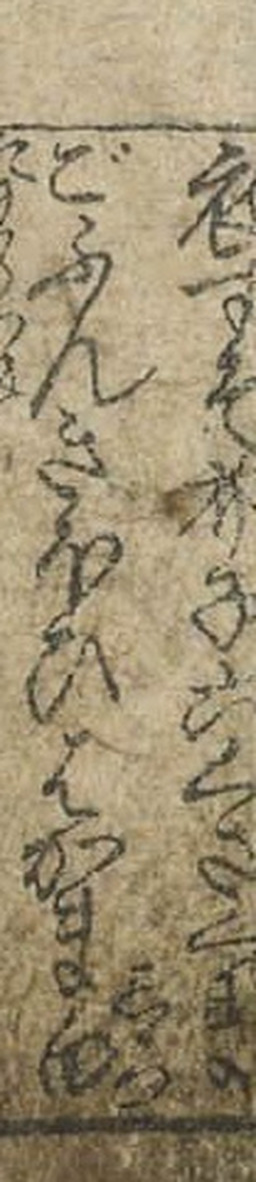ごふんきほひはかま白
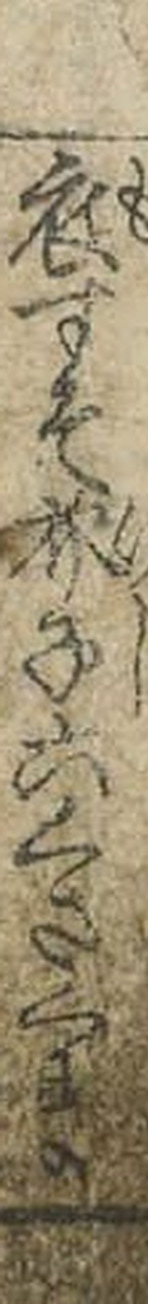衣すそ芥子六くさくま
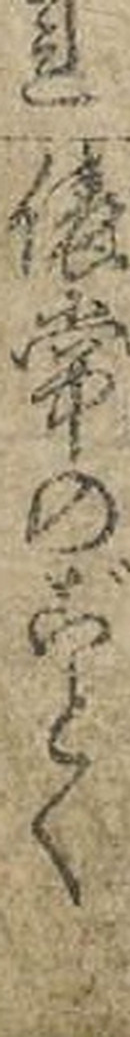俵常のごとく

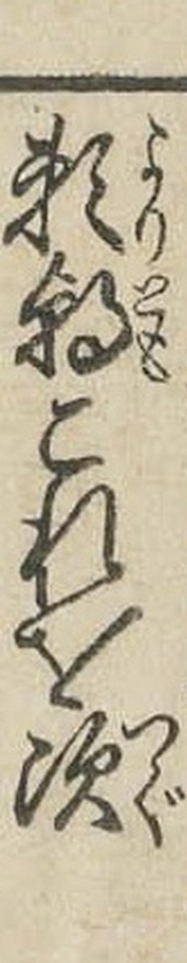頼朝これを次
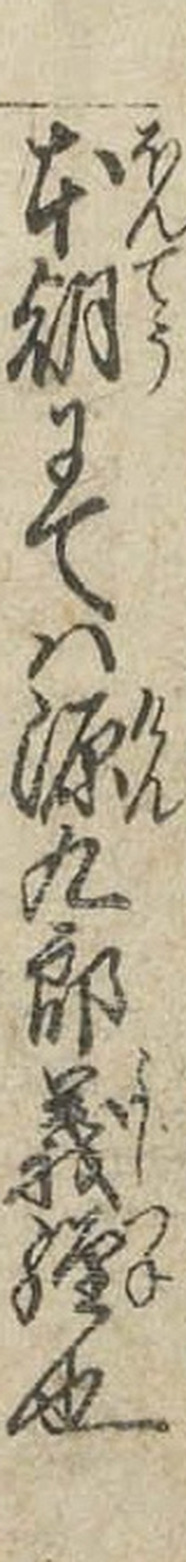本朝にては源九郎義経也
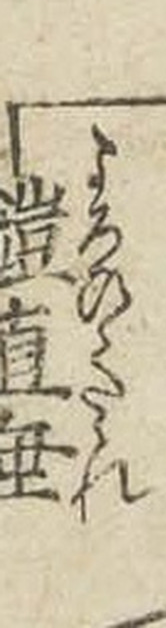鎧直垂
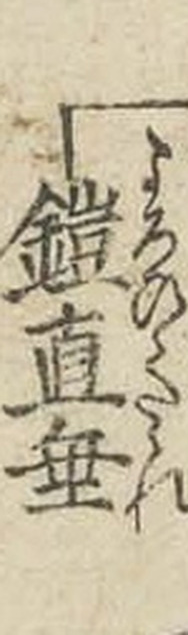鎧直垂
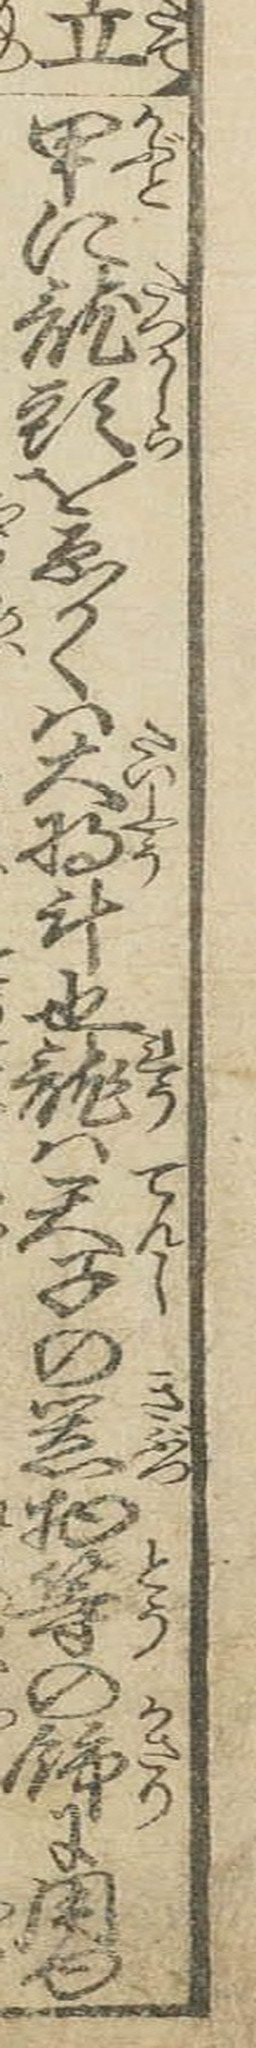甲に龍頭をゑかくは大将斗也龍は天子の器物等の飾に用ゆ
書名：絵本写宝袋 9巻 2之巻
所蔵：東京学芸大学教育コンテンツアーカイブ
